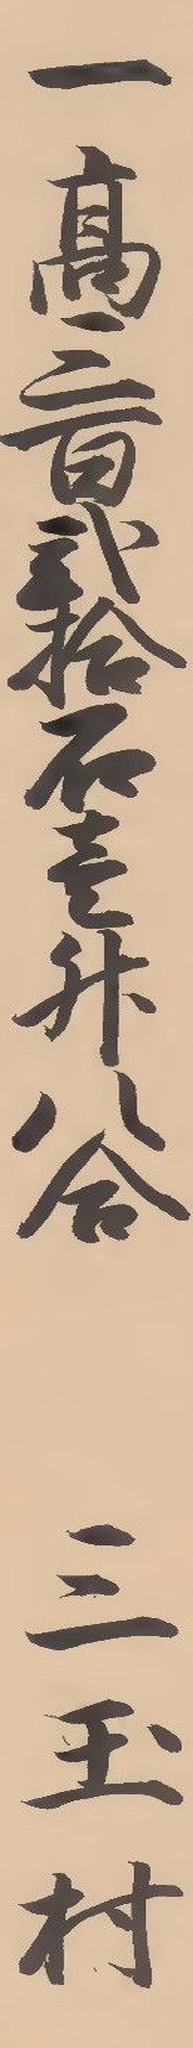一高三百弐拾石壱升八合三玉村
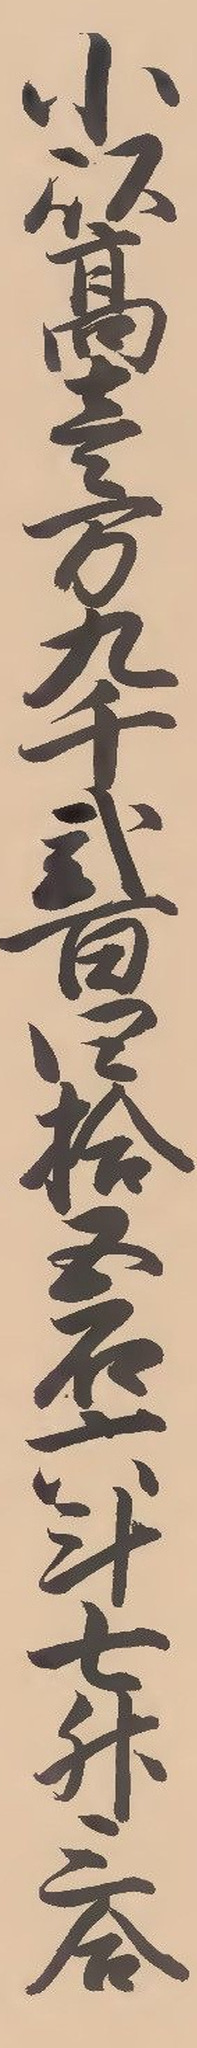小以高壱万九千弐百四拾五石六斗七升三合

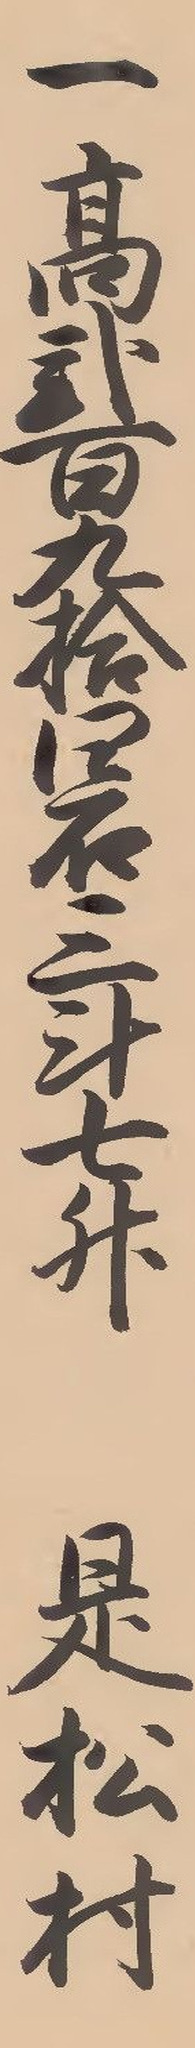一高弐百九拾四石三斗七升是松村
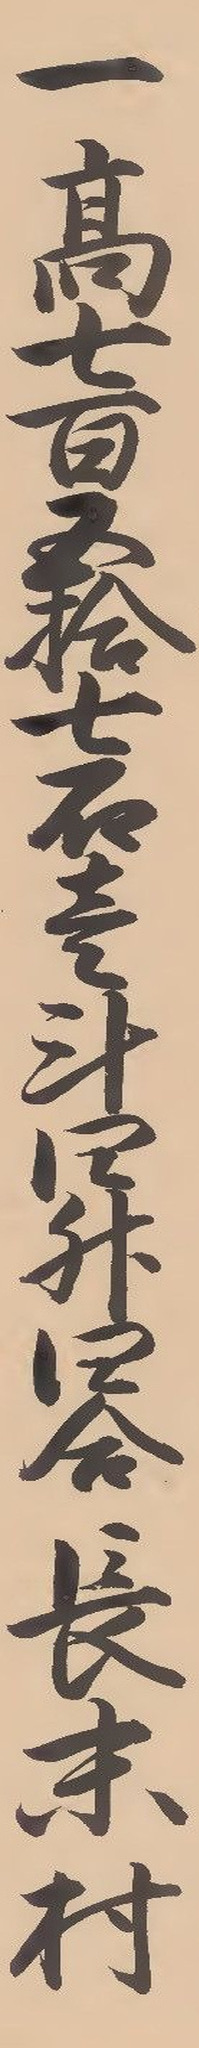一高七百五拾七石壱斗四升四合長末村
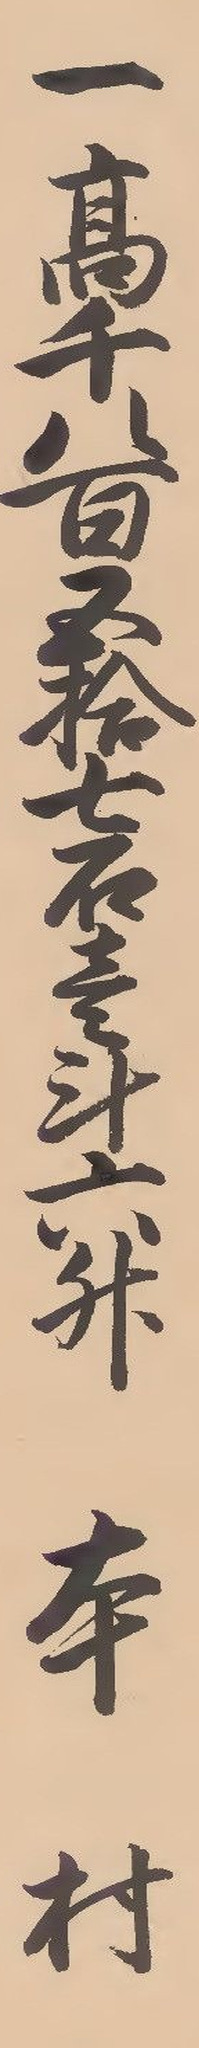一高千八百五拾七石壱斗六升本村

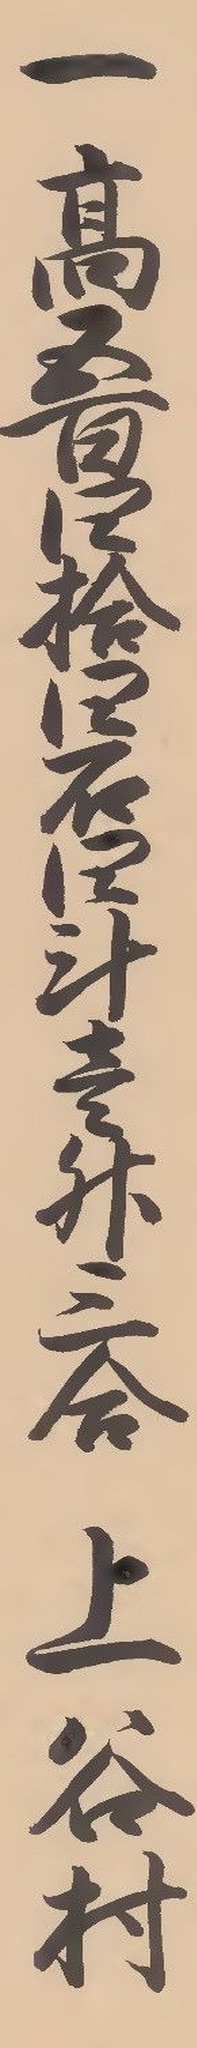一高五百四拾四石四斗壱升三合上谷村
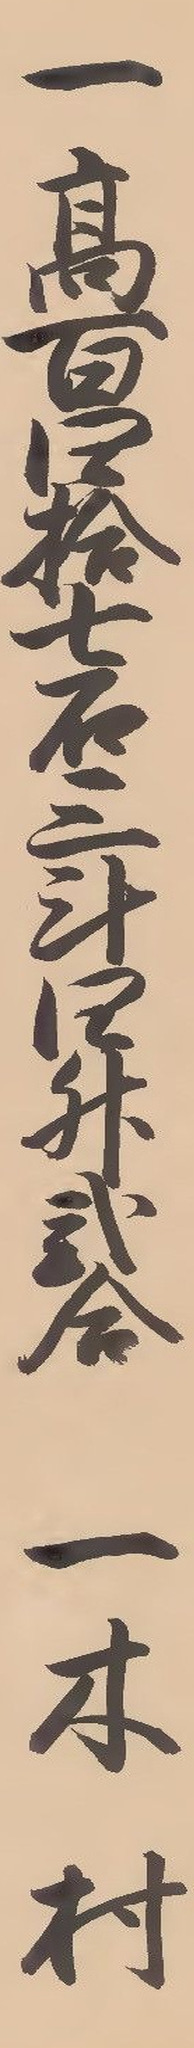一高百四拾七石三斗四升弐合一木村
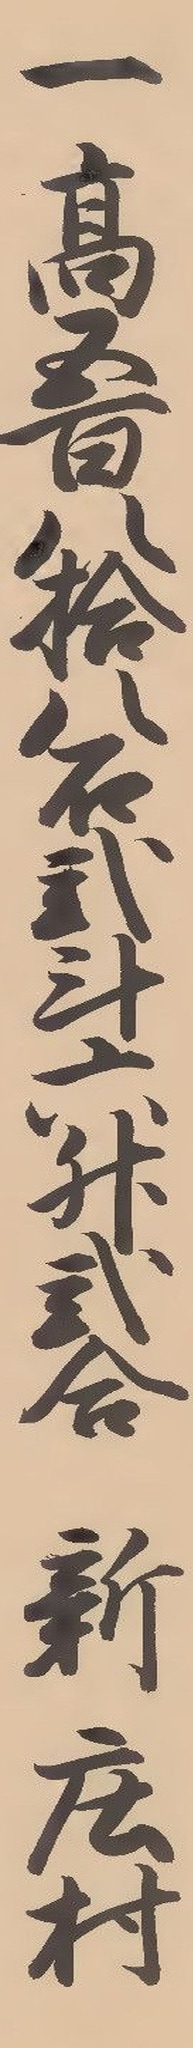一高五百八拾八石弐斗六升弐合新庄村
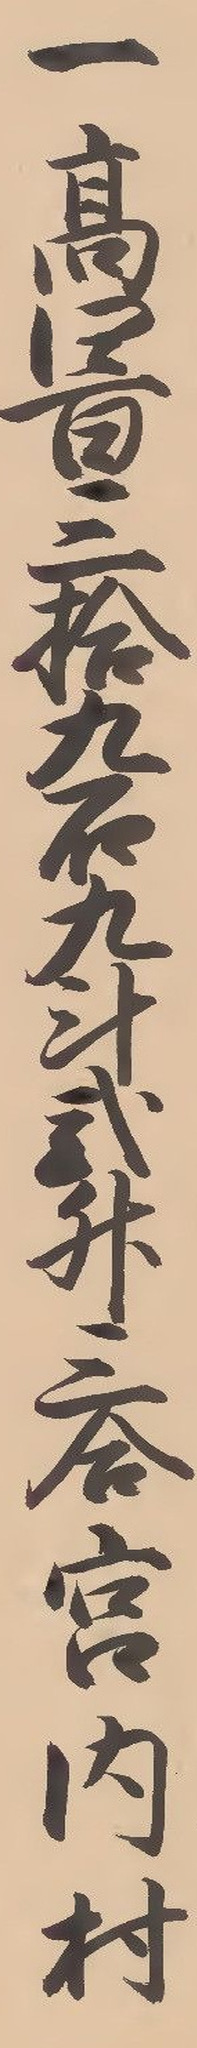一高四百三拾九石九斗弐升三合宮内村
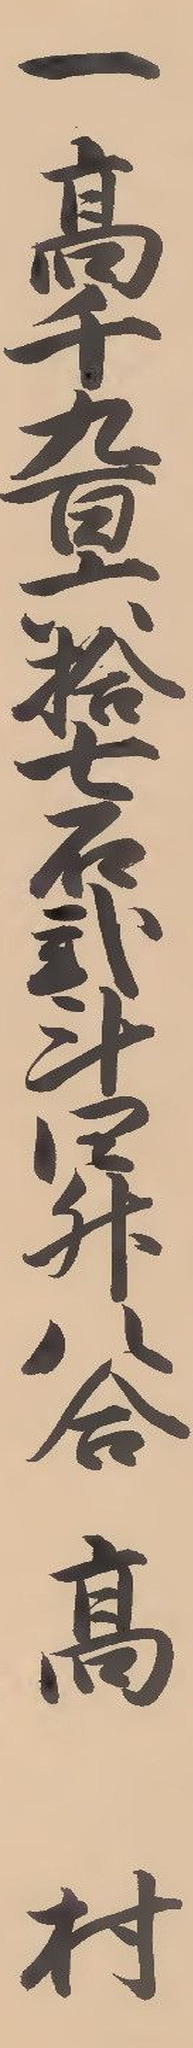一高千九百六拾七石弐斗四升八合高村
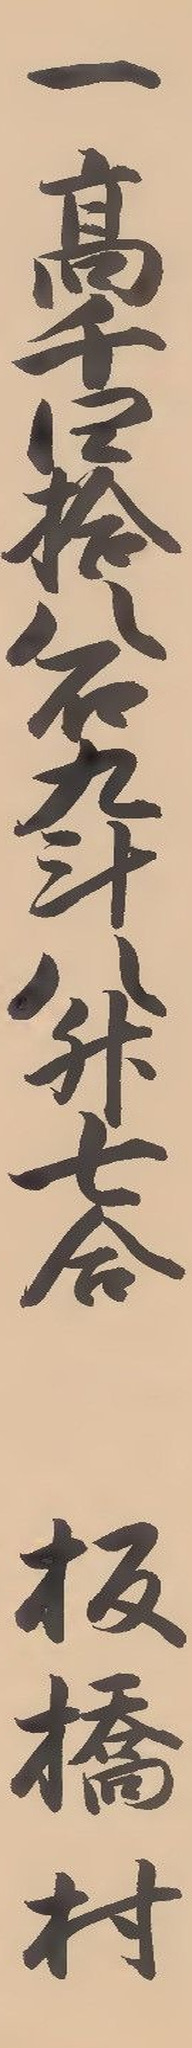一高千四拾八石九斗八升七合板橋村
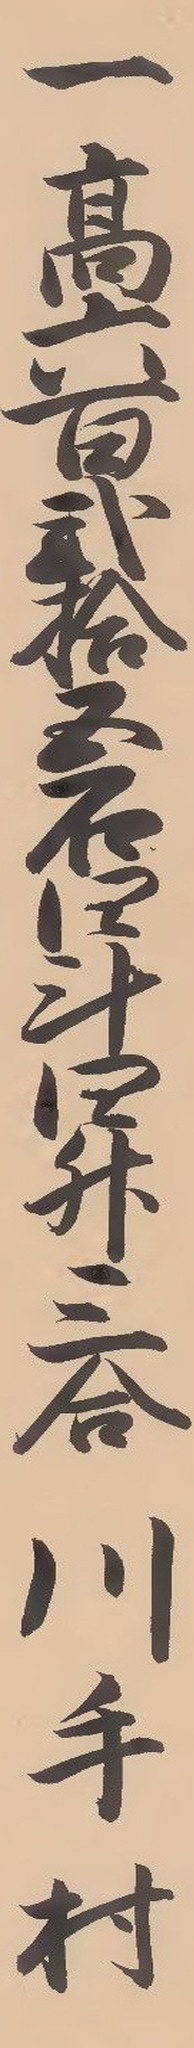一高六百弐拾五石四斗四升三合川手村
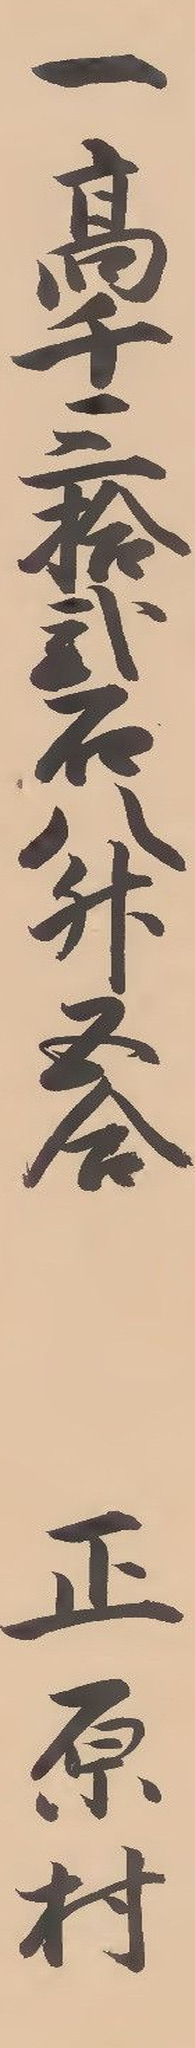一高千三拾弐石八升五合正原村

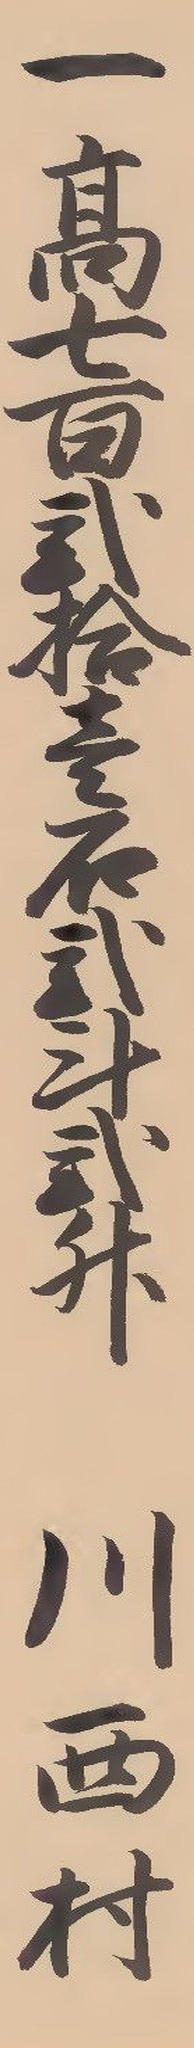一高七百弐拾壱石弐斗弐升川西村
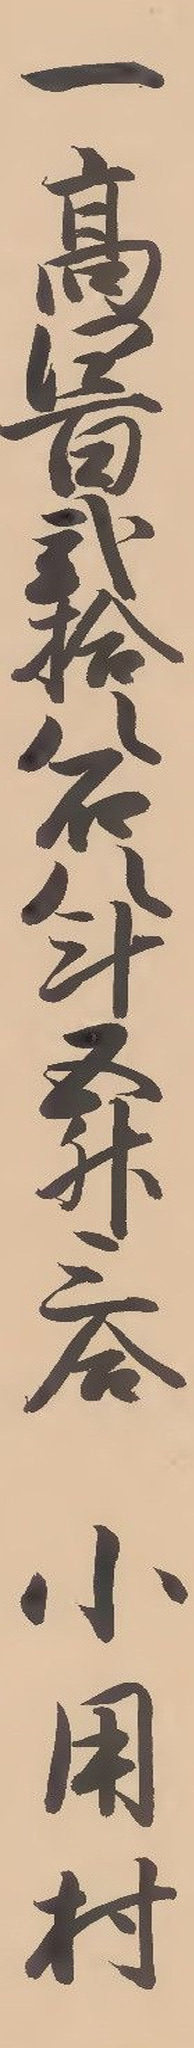一高四百弐拾八石八斗五升三合小用村
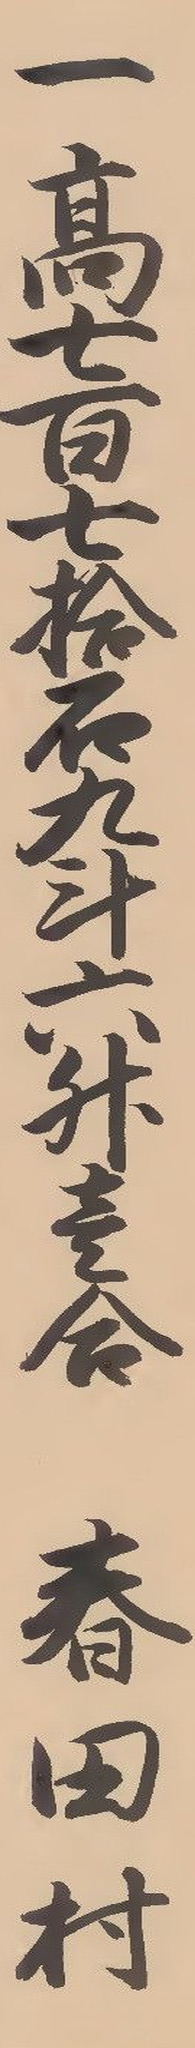一高七百七拾石九斗六升壱合春田村
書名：備後国郷帳
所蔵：国立公文書館 National Archives of Japan
